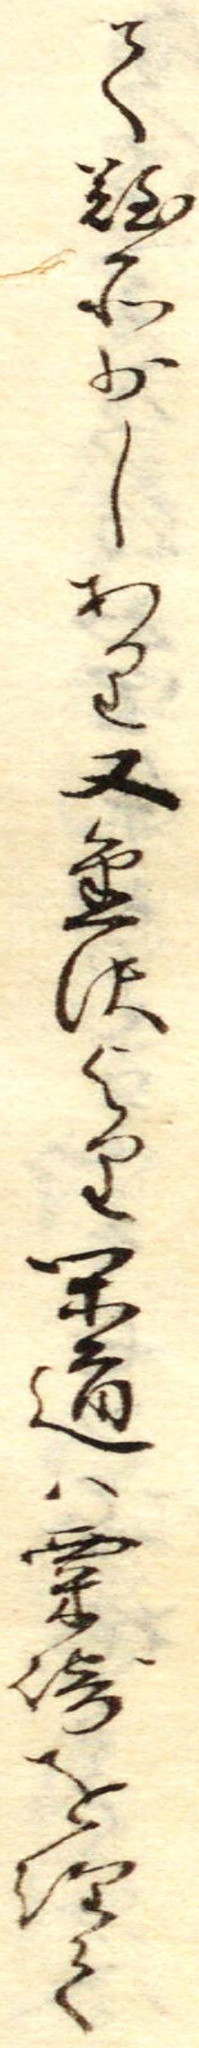て難所少しあり又金沢よりの閑道ハ粟崎を経て

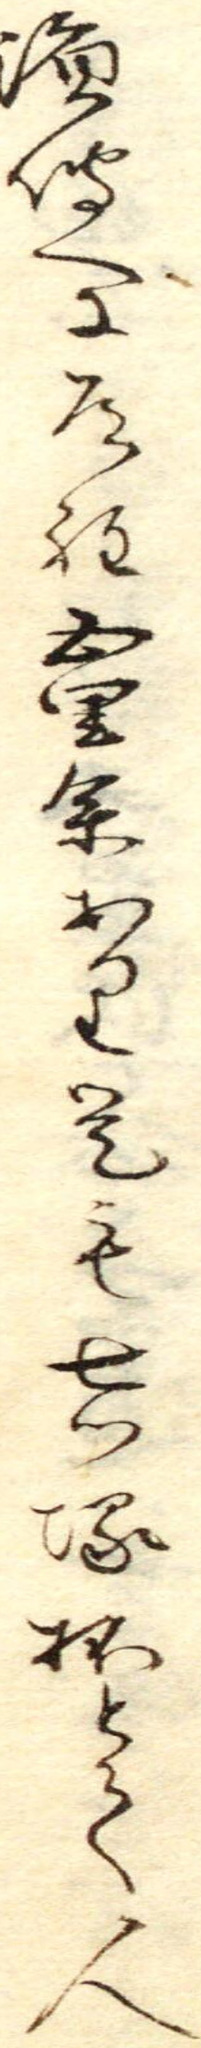濱傳へに道程五里あり是も七ッ塚抔とて人
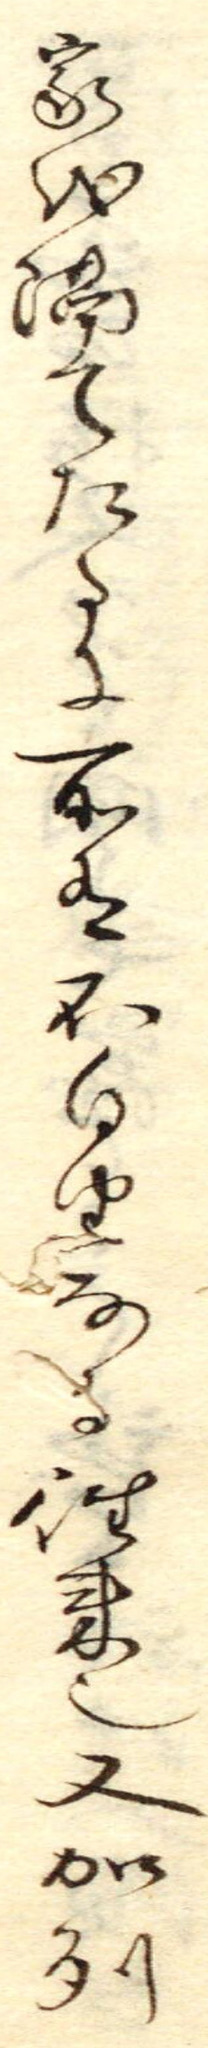家を隔てたるに所有不自由なる往来也又加州
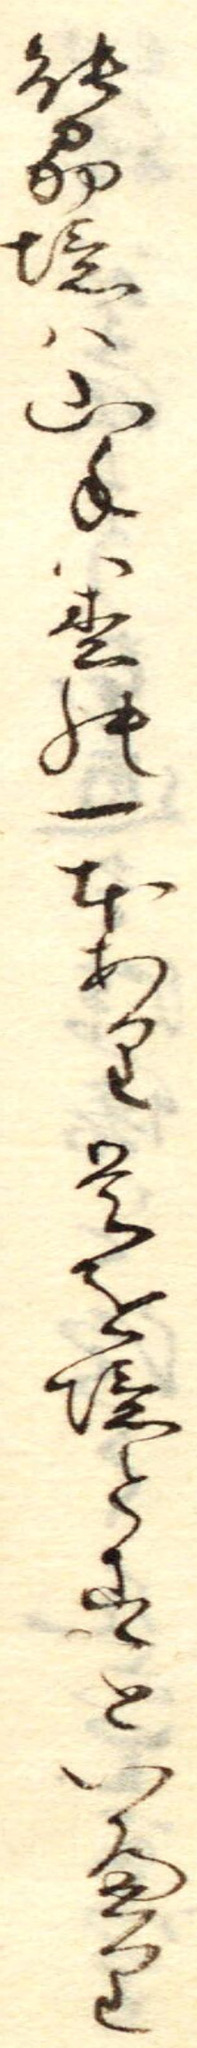能州境は山手は松の一本あり是を境とすといへり
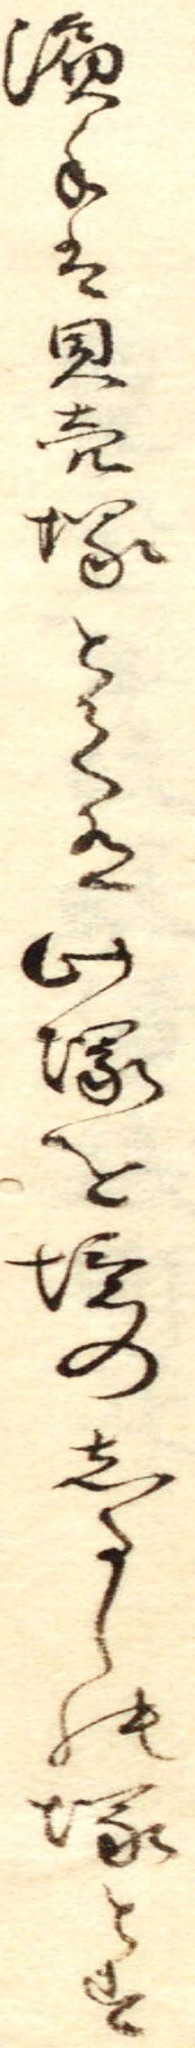濱手は貝売塚とて有此塚を境のしるしの塚とす
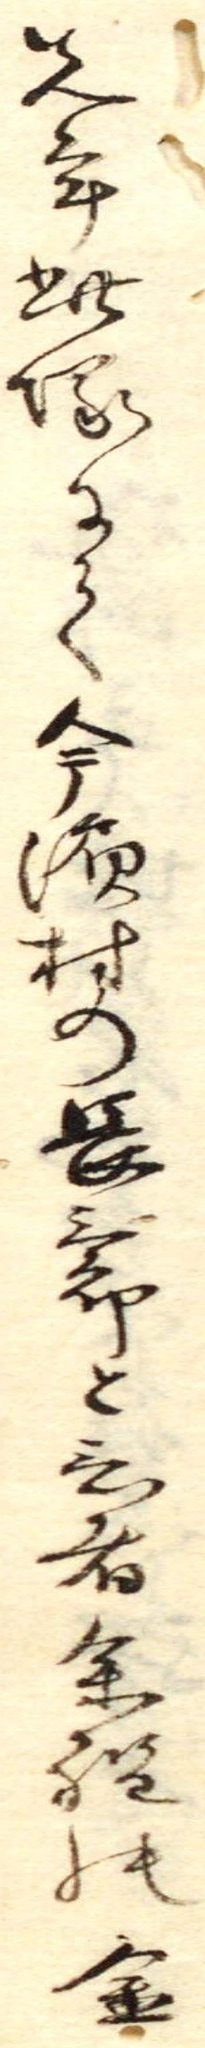先年此塚にて今濱村の長三郞と云者余程の金
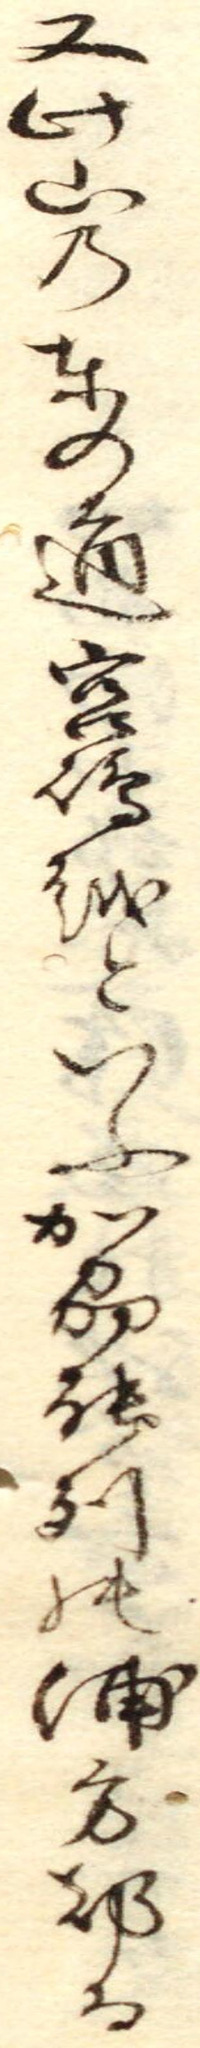又此山乃東の道宮島越といふ加州能州の浦方都て
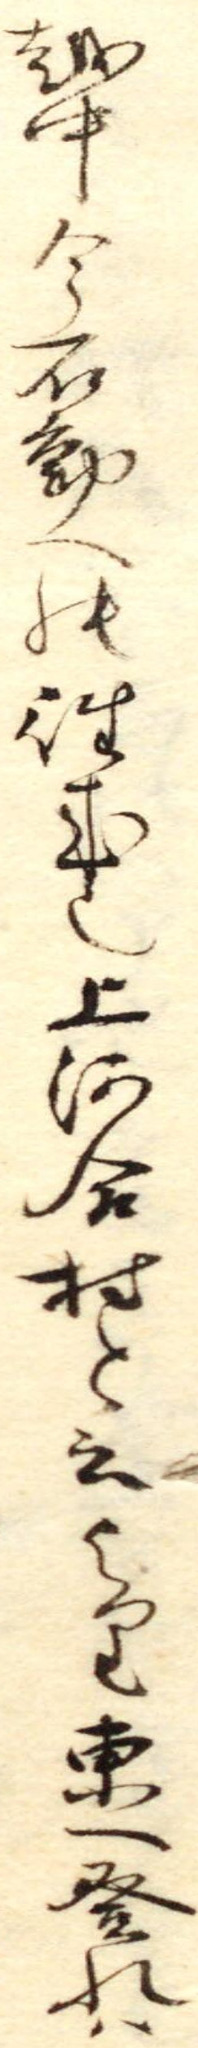越中今石動への徃來也上河合村と云より東へ登れは
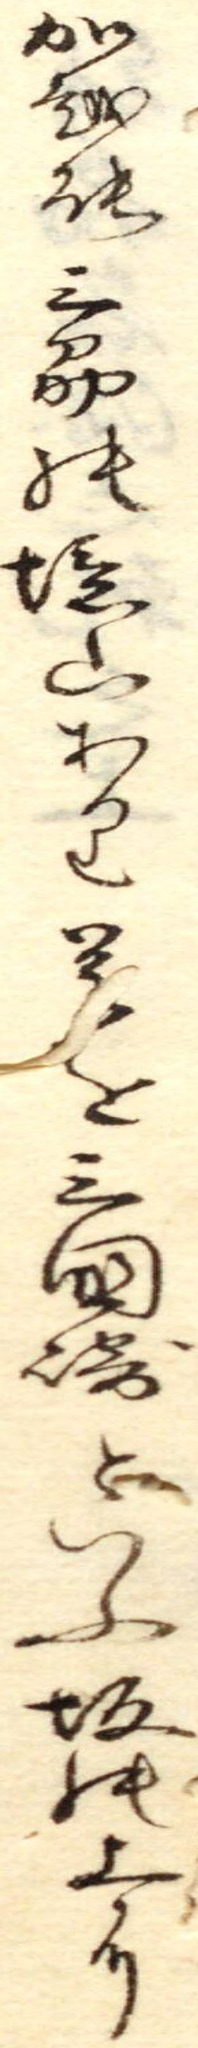加越能三州の境山あり是を三國崎といふ坂の上に
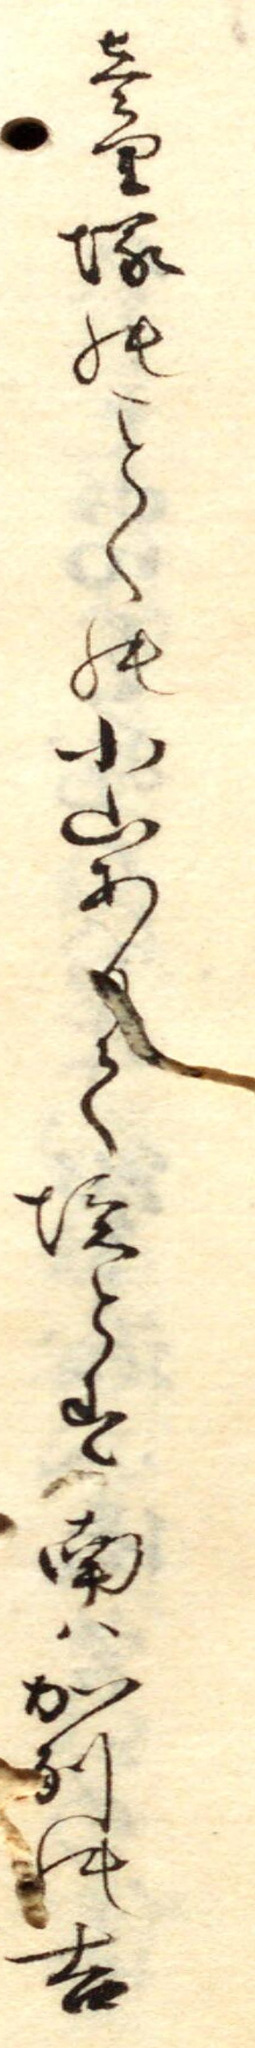壱里塚のことくの小山ありて境とす南は加州の吉
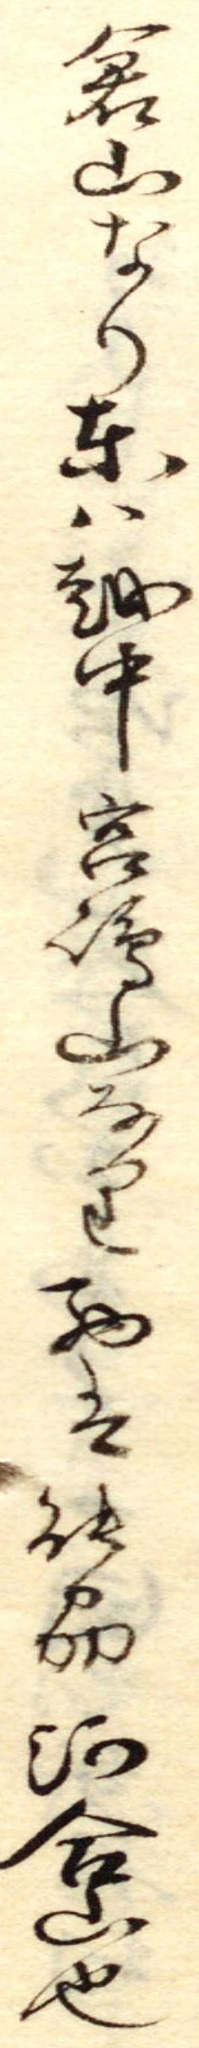倉山なり東は越中宮島山なり西は能州河合山也
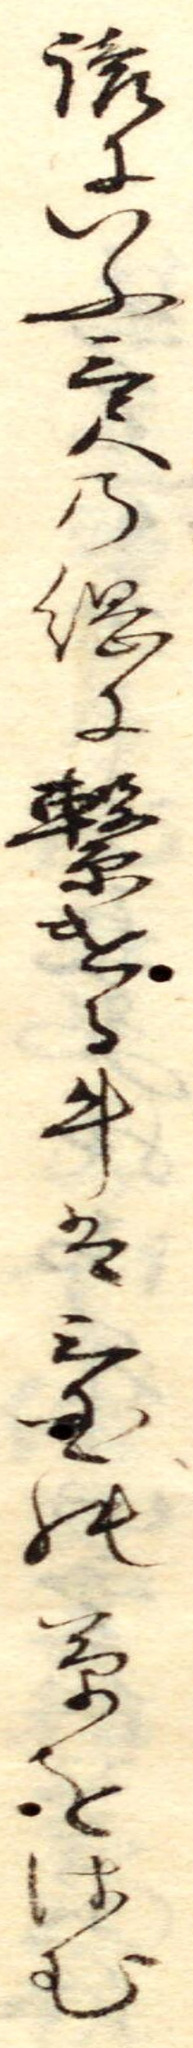諺にいふ三尺乃綱に繋ける牛は三国の草をはむ
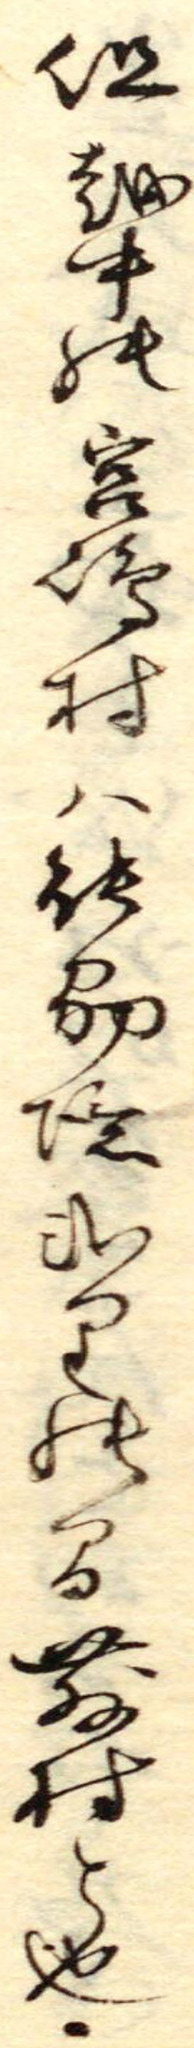但越中の宮島村は能州境弐里の間の散村と也
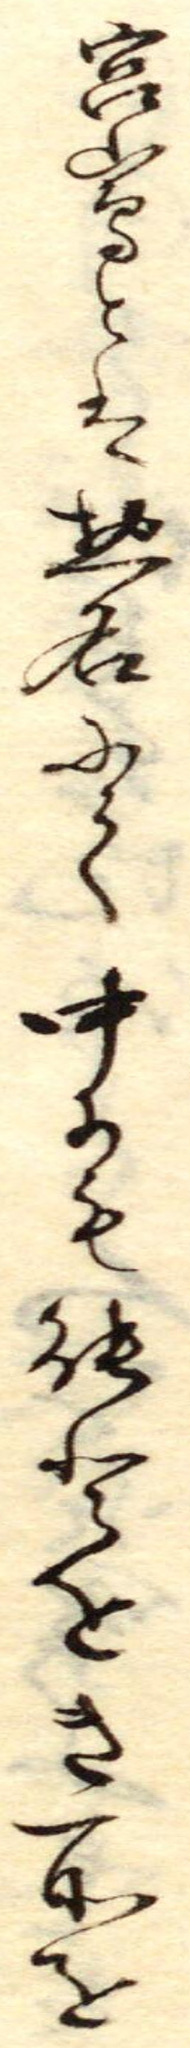宮島とは惣名にて中にも能登近き所を
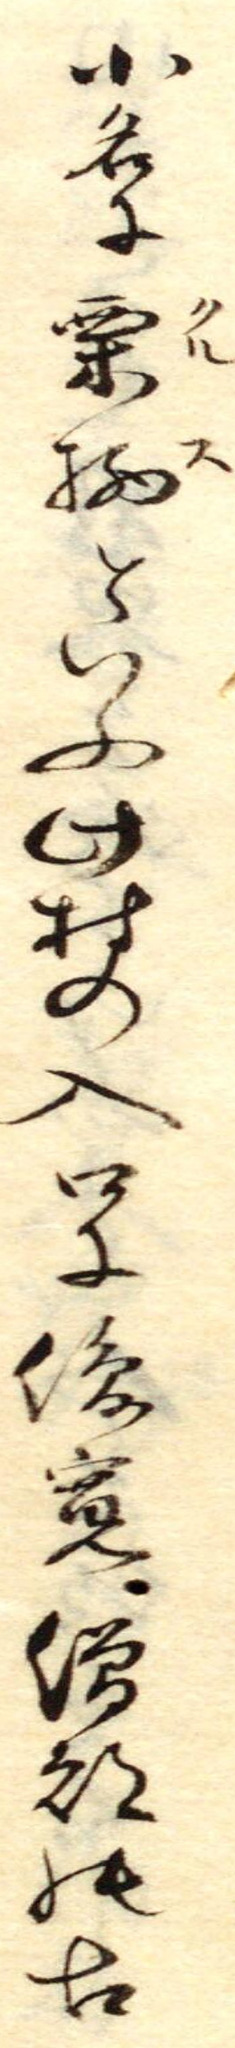小名に栗栖といふ此村の入口に俊寛僧都の古
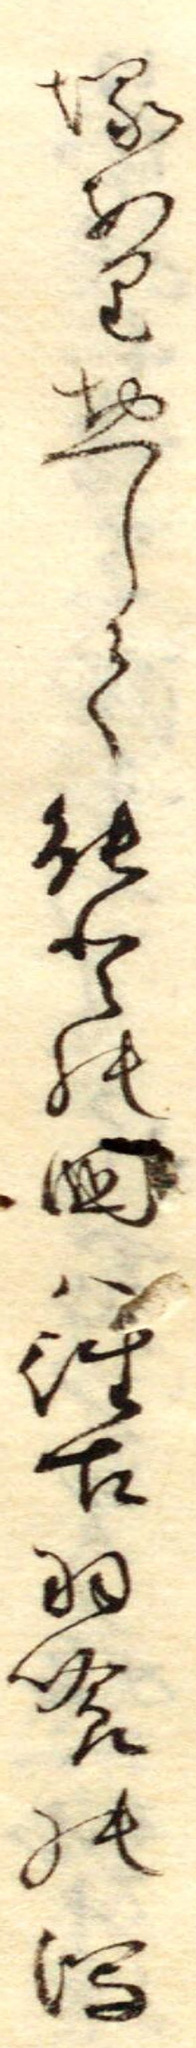塚あり惣して能登の國は往古羽喰の潟
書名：能登名跡誌
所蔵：Ishikawa Prefectural Library
